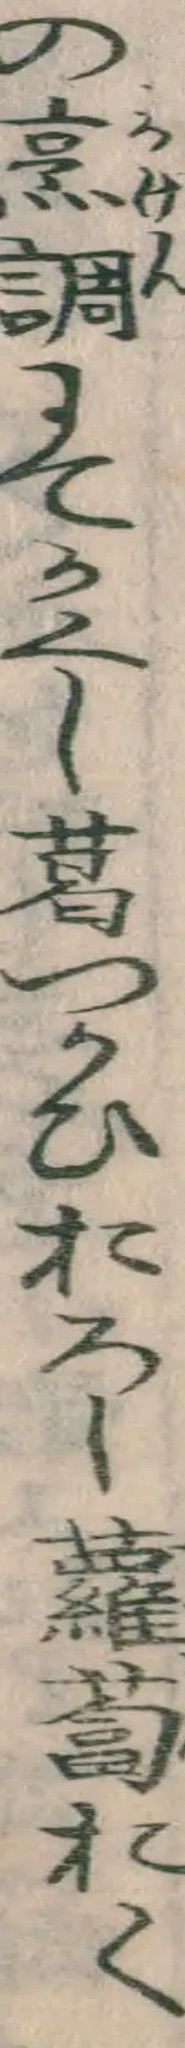の烹調にてかくし葛つかひおろし蘿蔔おく

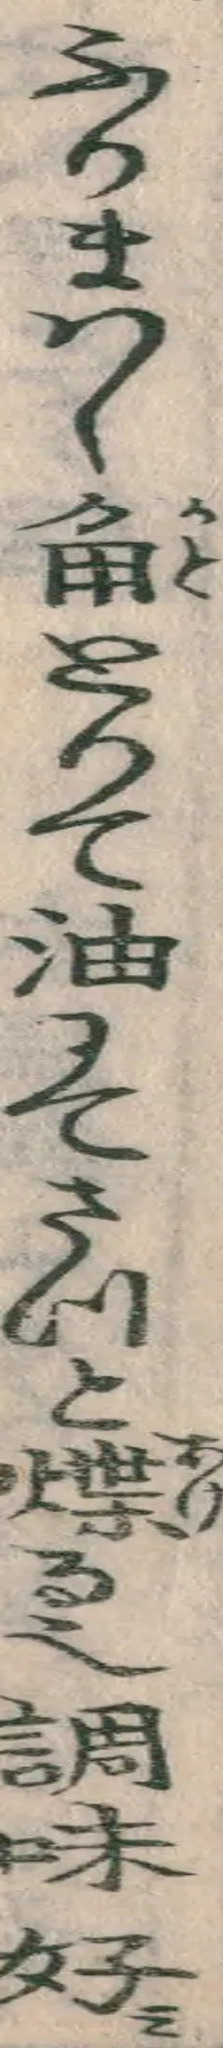ふりまはし角とりて油にてさつと煠る也調味好み
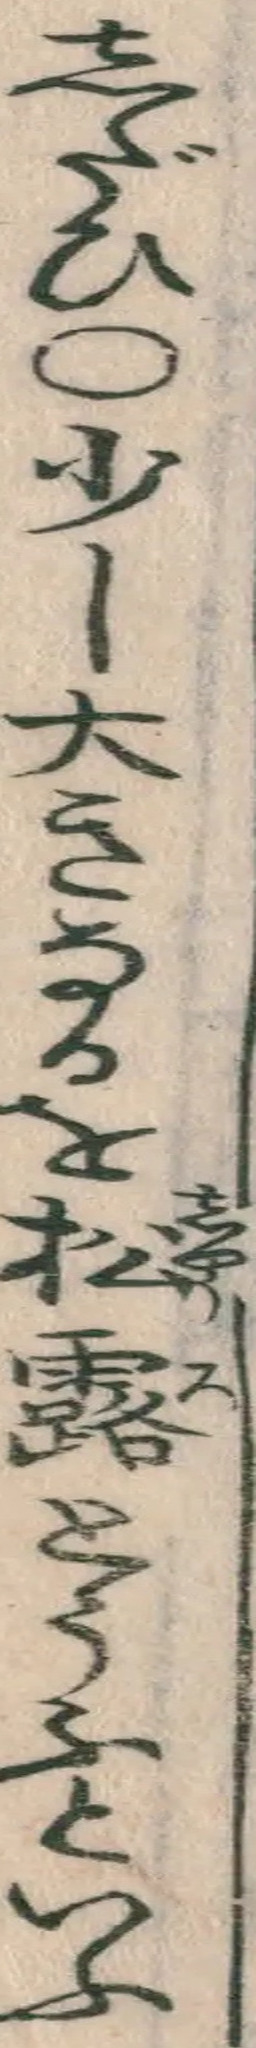しだひ○少し大きなるを松露とうふといふ
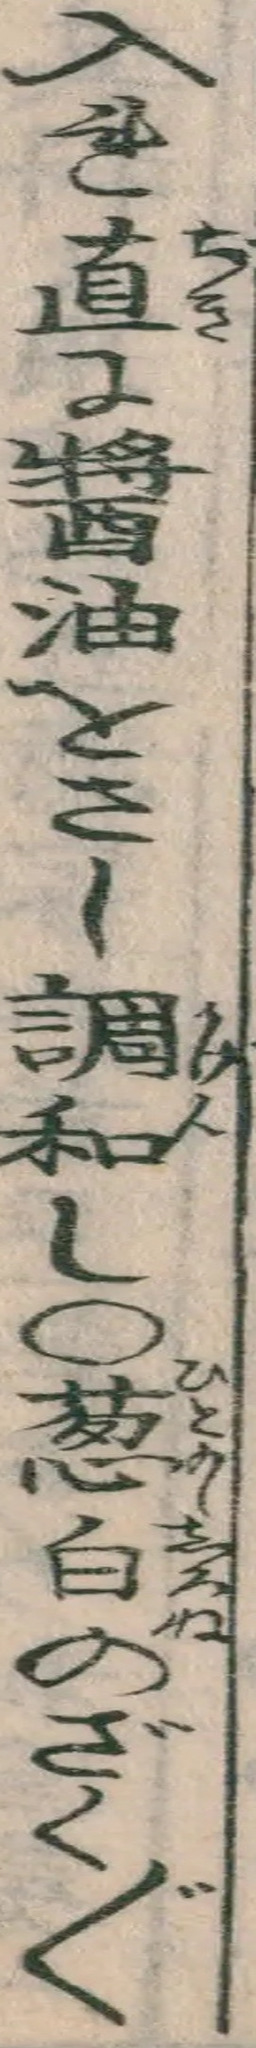入れ直に醤油をさし調和し○葱白のざく〴〵
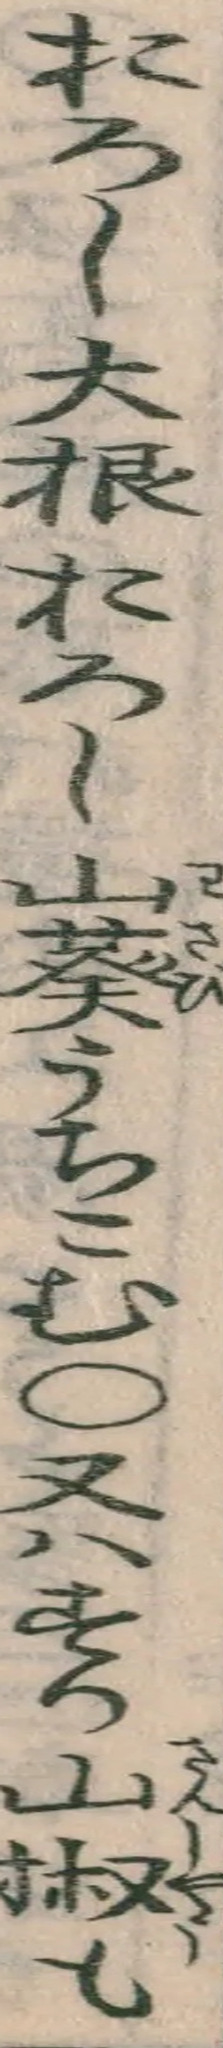おろし大根おろし山葵うちこむ○又はすり山椒も
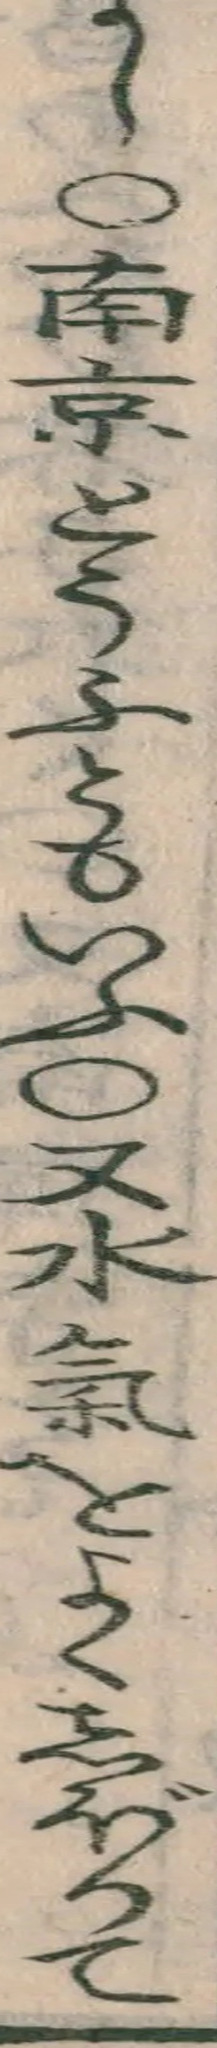よし○南京とうふともいふ○又水氣をよくしぼりて

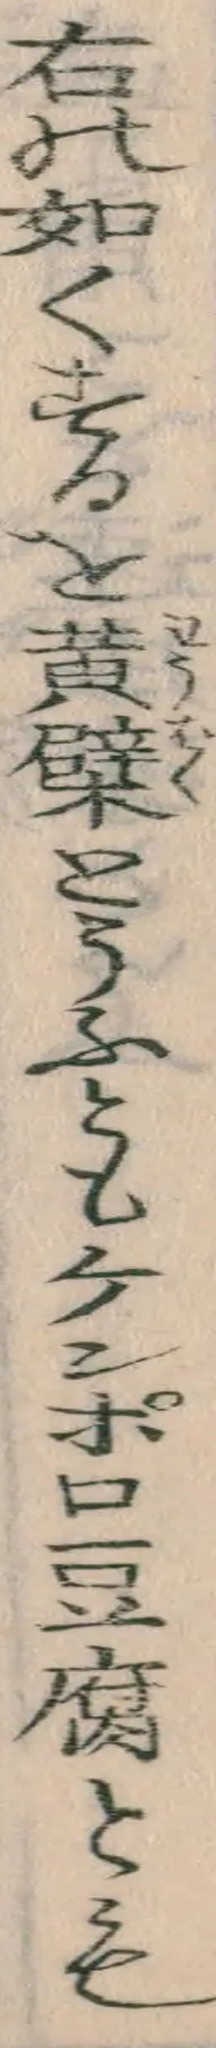右の如くするを黄檗とうふともケンポロ豆腐とも
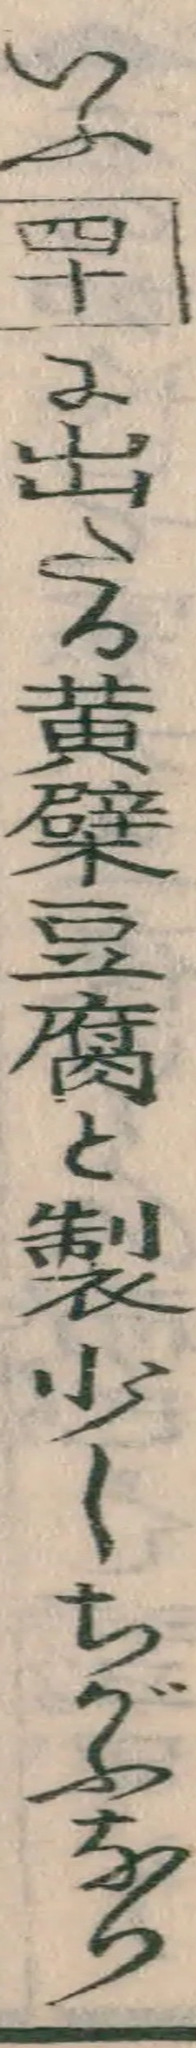いふ[四十]に出たる黄檗豆腐と製少しちがふなり
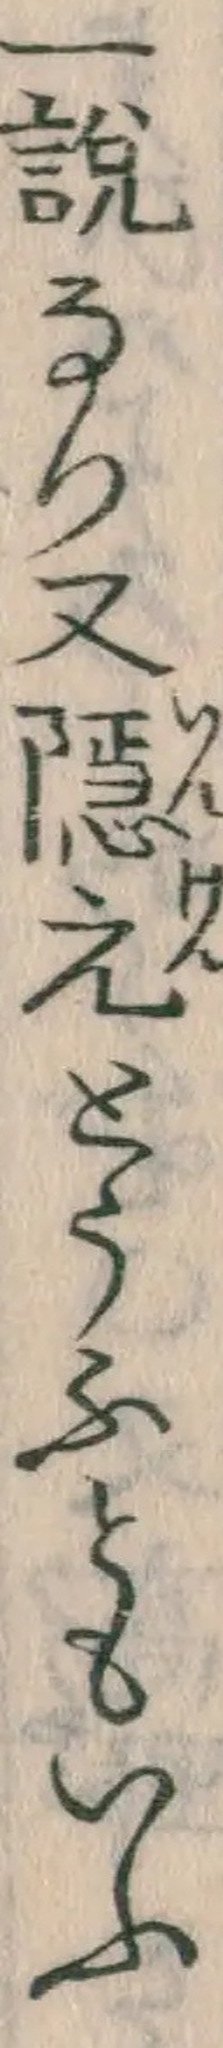一説なり又隠元とうふともいふ
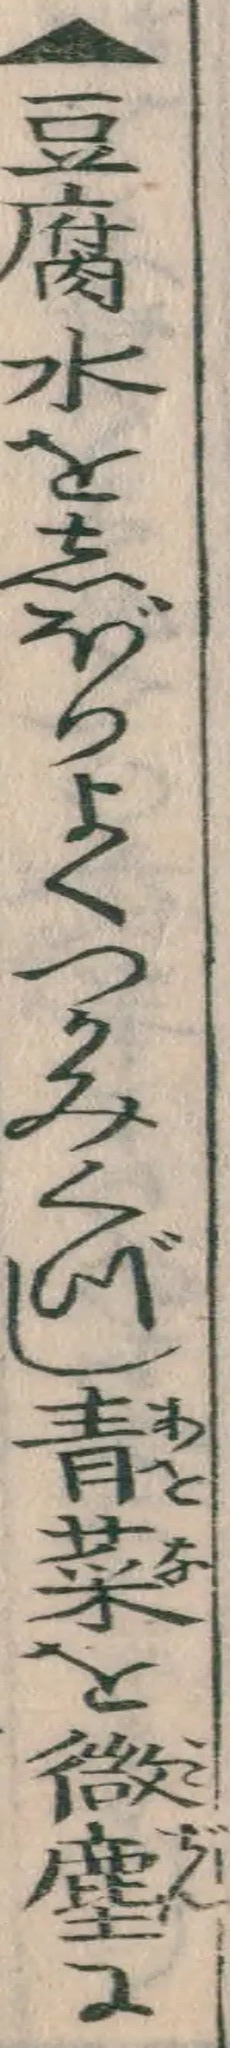▲豆腐水をしぼりよくつかみくづし青菜を微塵に
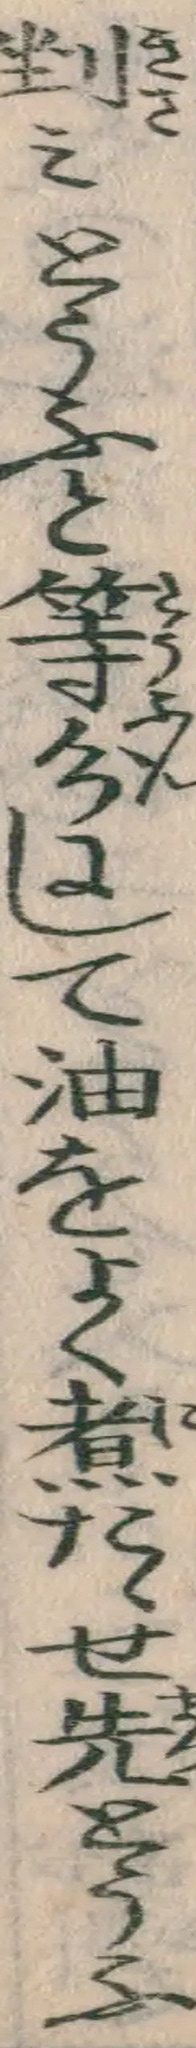剉みとうふと等分にして油をよく煮たゝせ先とうふ
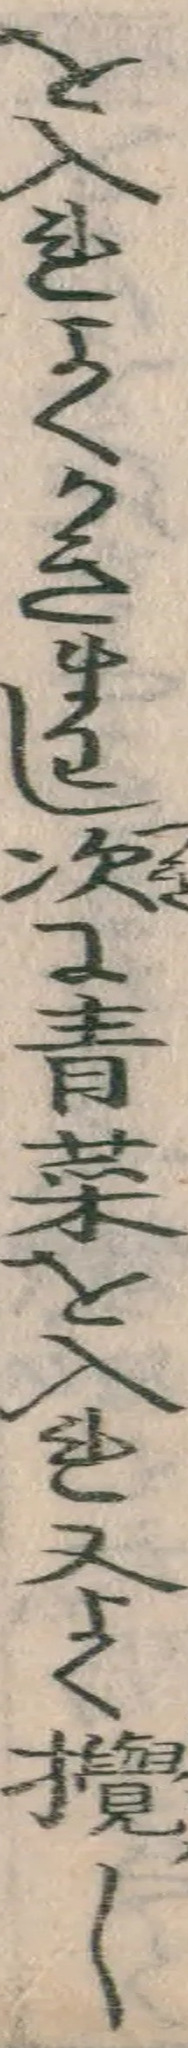を入れよくかきまわし次に青菜を入れ又よく攪し
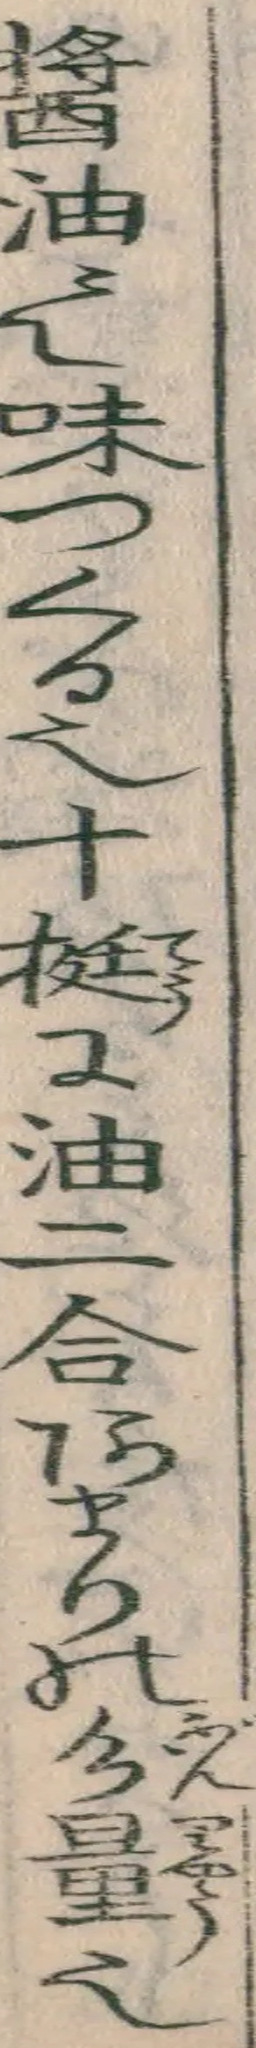醤油にて味つくる也十挺に油二合あまりの分量也
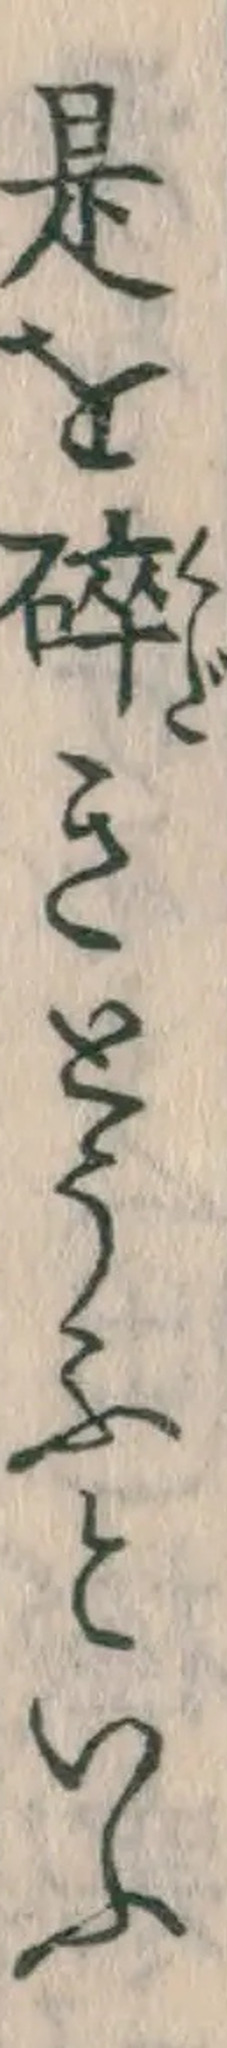是を碎きとうふといふ

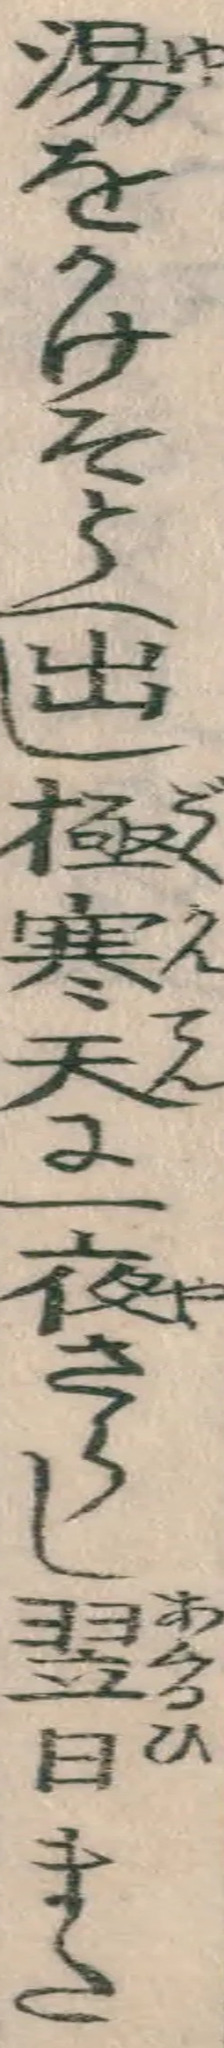湯をかけそとへ出し極寒天に一夜さらし翌日また
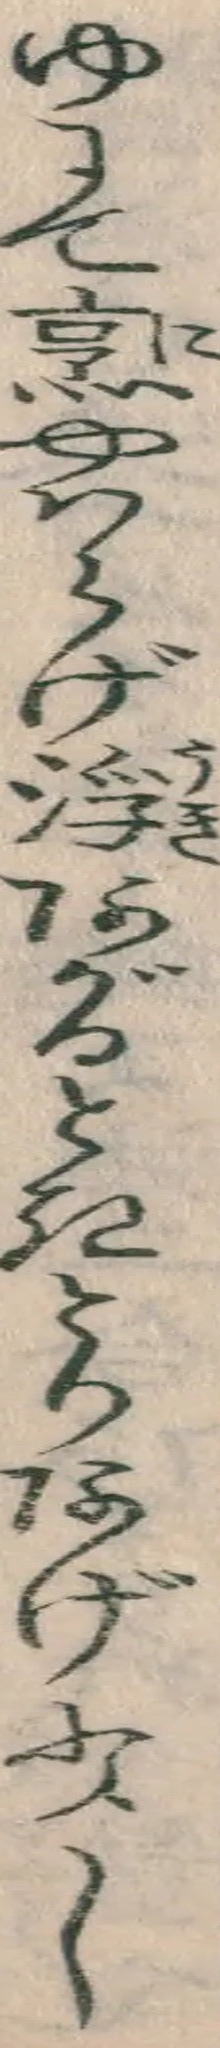ゆにて烹やはらげ浮あがるときとりあげ少し
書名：豆腐百珍. [正編]
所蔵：国立国会図書館 National Diet Library, JAPAN
